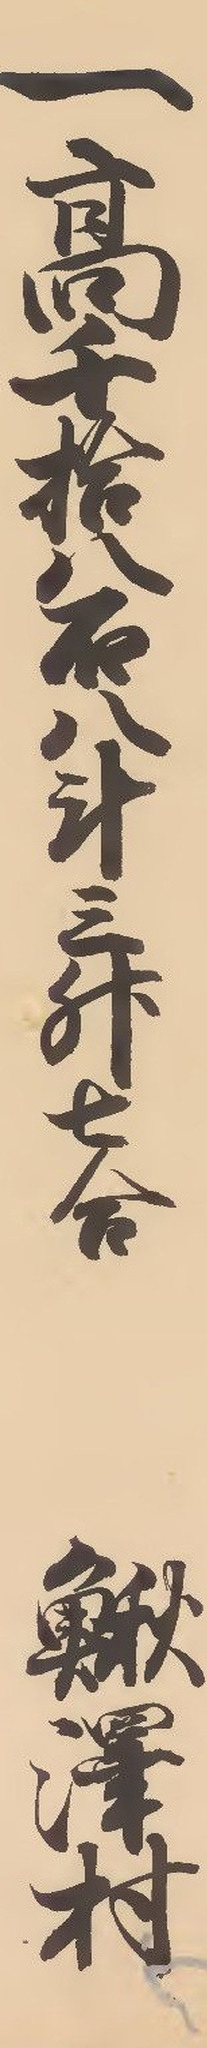一高千拾八石八斗三升七合鰍沢村
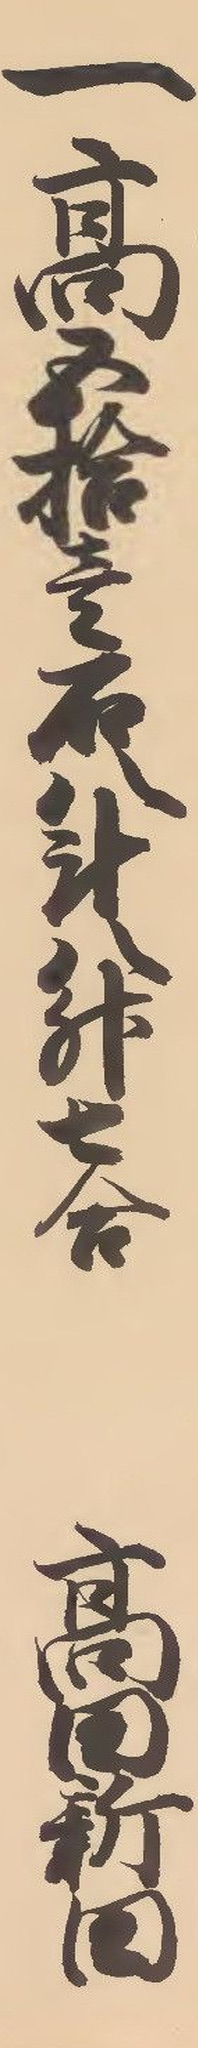一高五拾壱石八斗八升七合高田新田
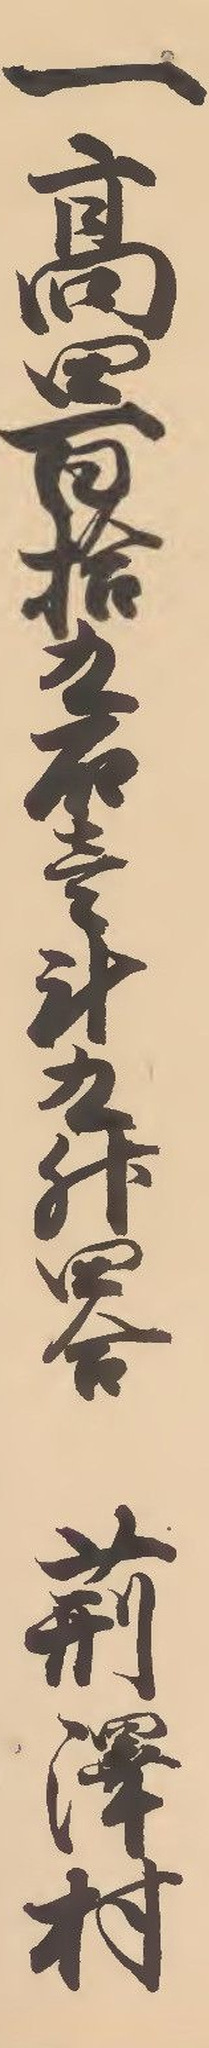一高四百拾九石壱斗九升四合荊沢村
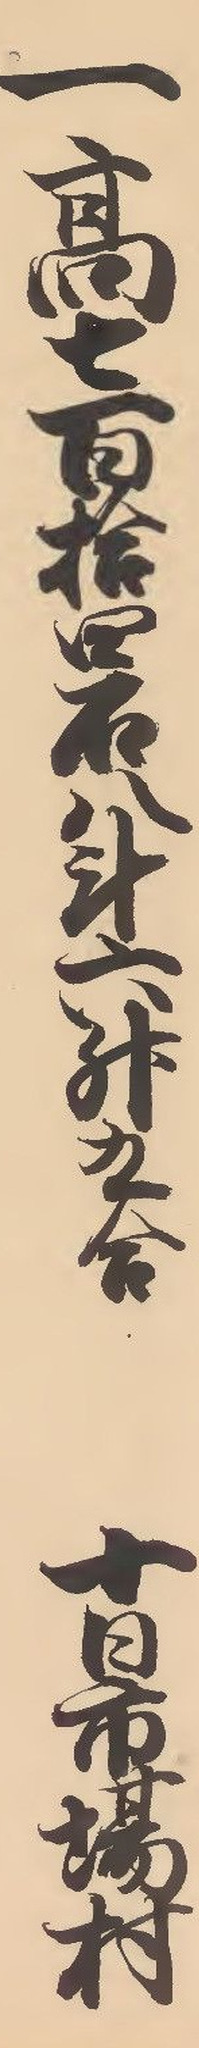一高七百拾四石八斗六升九合十日市場村
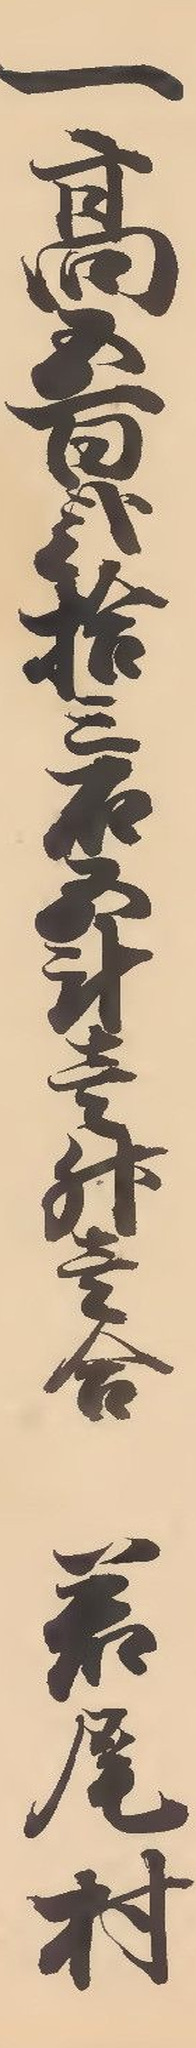一高五百弐拾三石五斗壱升壱合若尾村
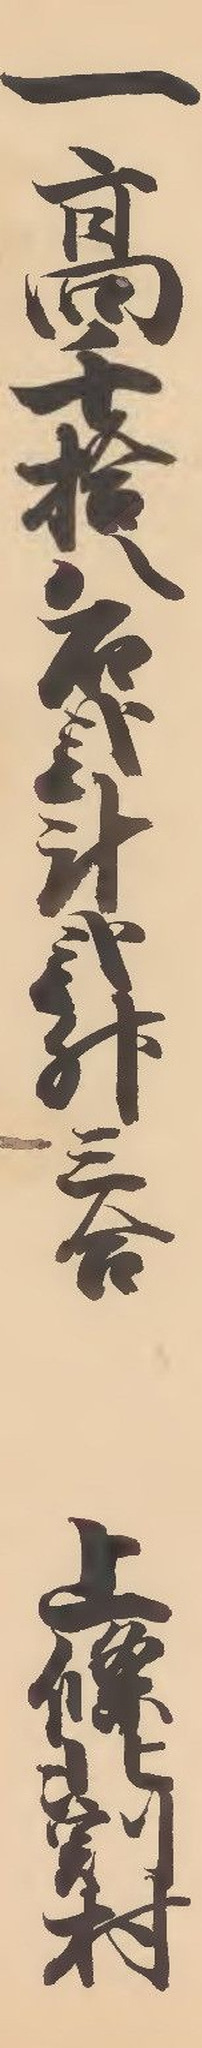一高千拾八石弐斗弐升三合上条北割村

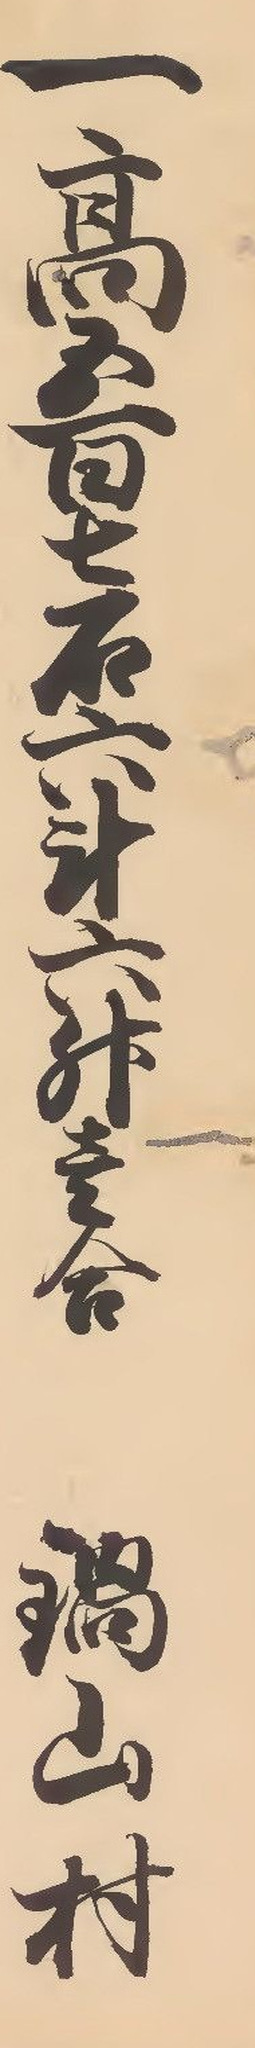一高五百七石六斗六升壱合鍋山村
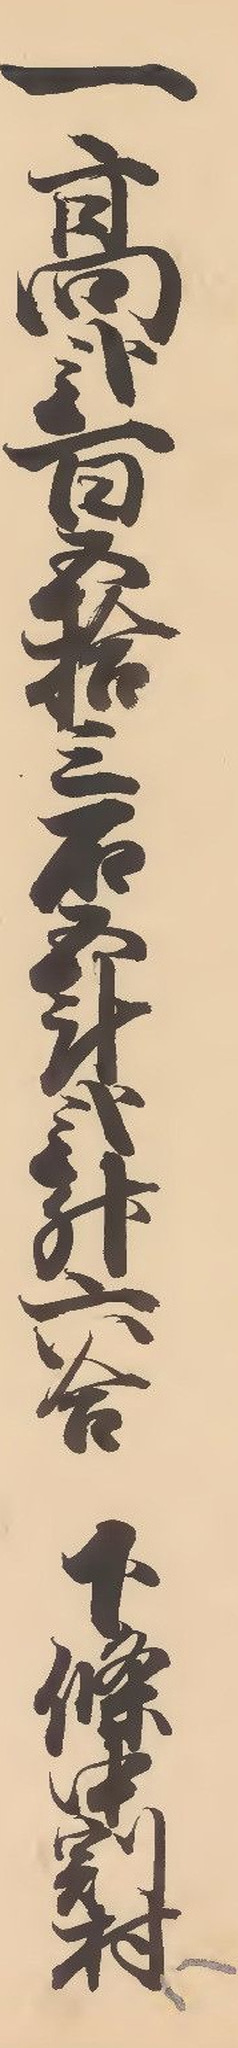一高弐百五拾三石五斗弐升六合下条中割村
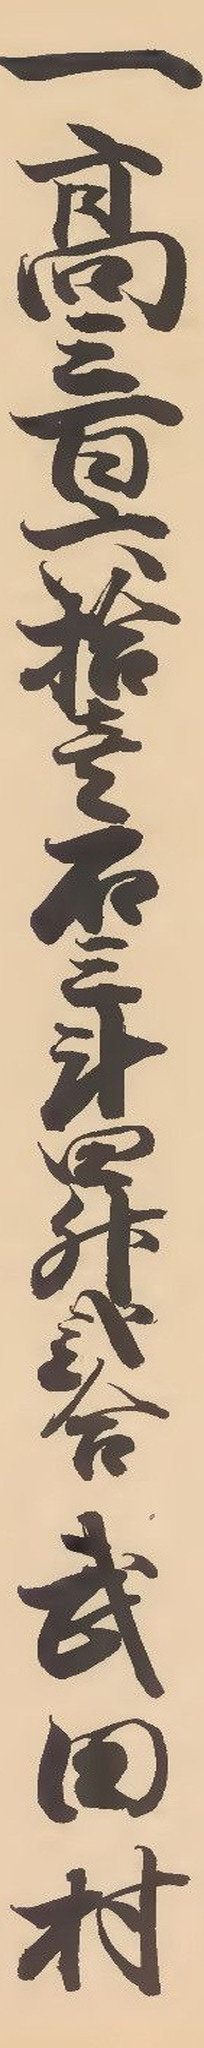一高三百六拾壱石三斗四升弐合武田村
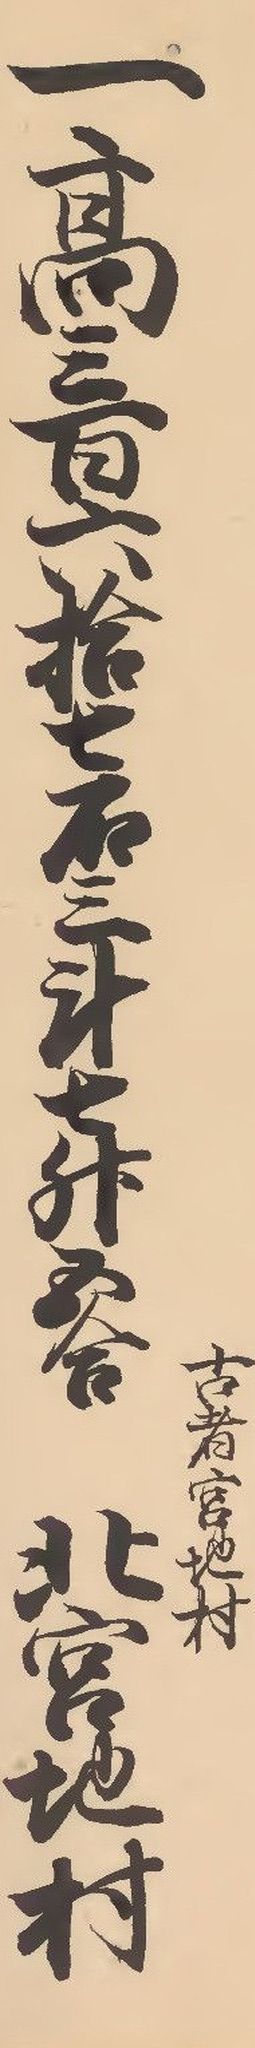一高三百六拾壱石三斗四升弐合武田村
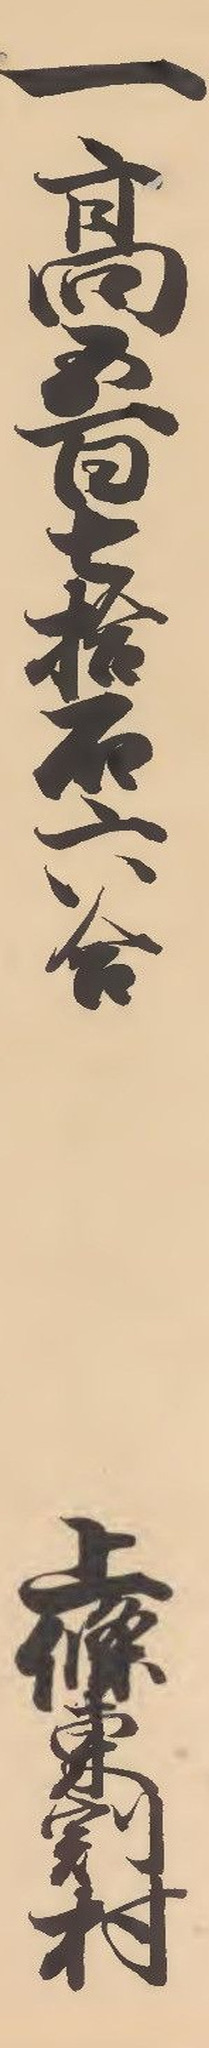一高五百七拾石六合上条東割村
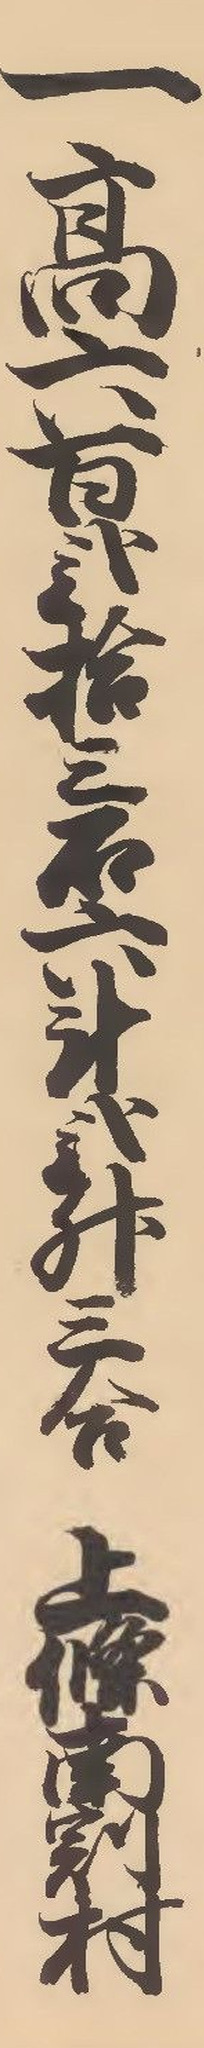一高六百弐拾三石六斗弐升三合上条南割村
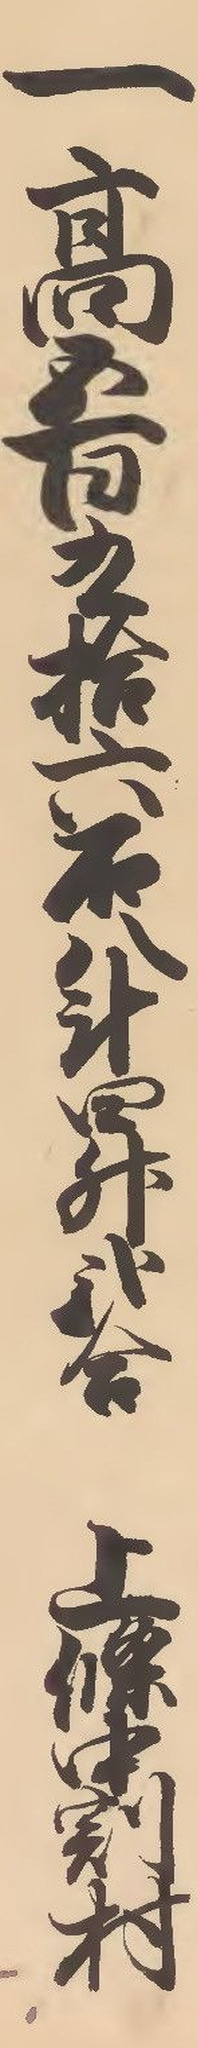一高五百九拾六石八斗四升弐合上条中割村
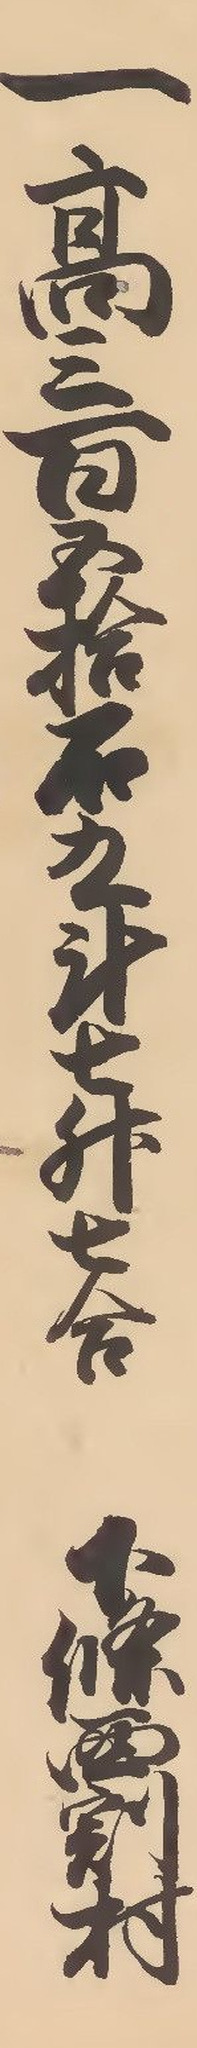一高三百五拾石九斗七升七合下条西割村

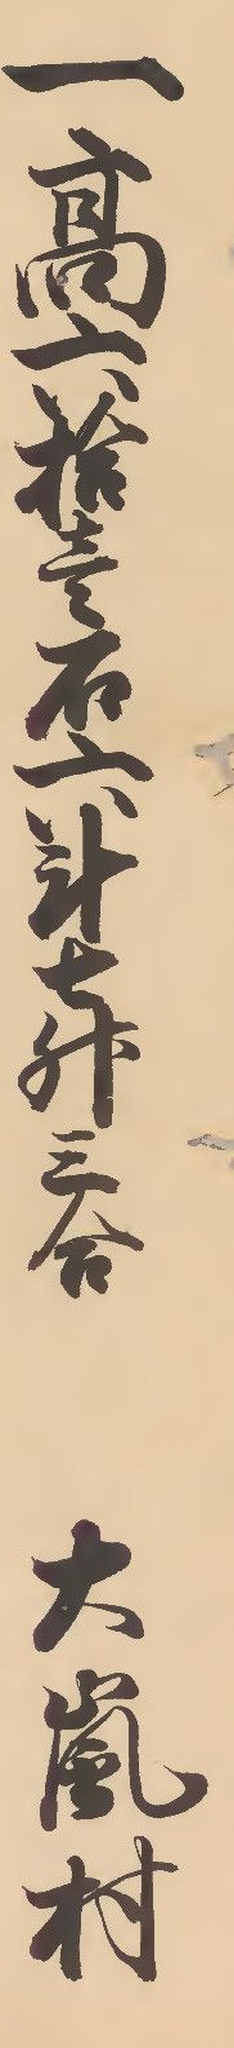一高六拾壱石六斗七升三合大嵐村
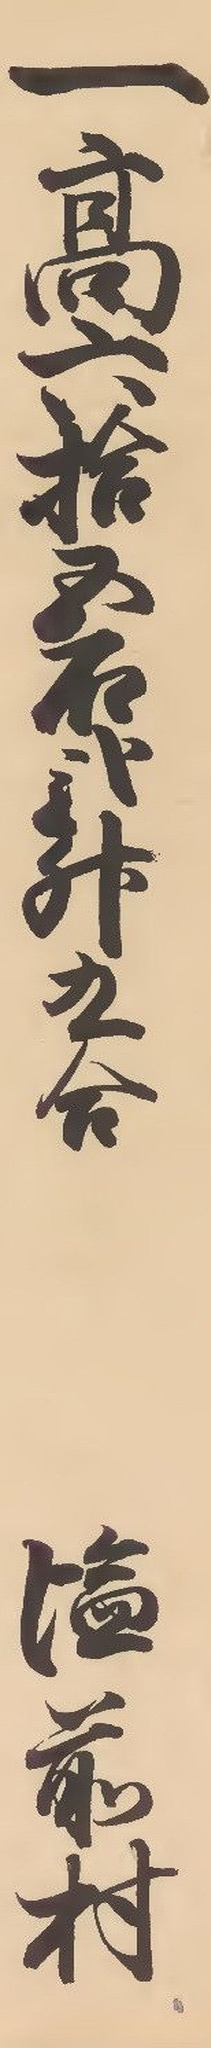一高六拾五石弐升九合塩前村
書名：甲斐国郷帳
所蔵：国立公文書館 National Archives of Japan
